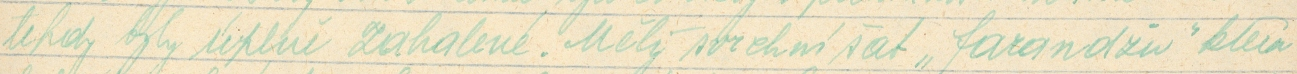tehdy byly úplně zahalené. Měly svrchní šat „farandžu“ která
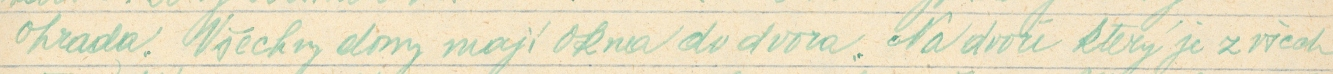ohrada. Všechny domy mají okna do dvora. Na dvoře který je z všech
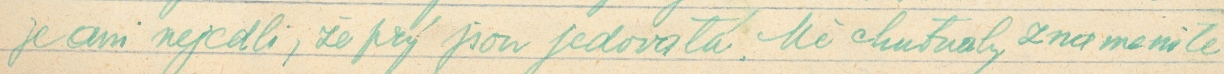je ani nejedli, že prý jsou jedovatá. Mě chutnaly znamenitě.
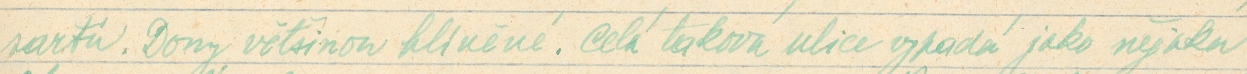sartů. Domy většinou hlíněné. Celá taková ulice vypadá jako nějaká
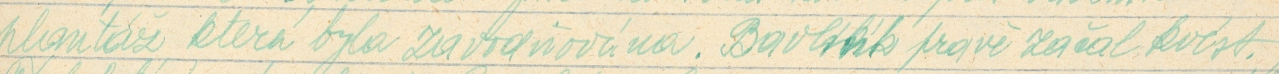plantáž, která byla zavodňována. Bavlník právě začal kvést.
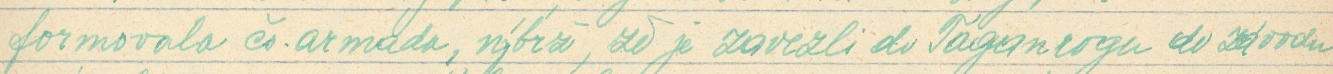formovala čs. armada, nýbrž, že je zavezli do Taganrogu do závodu
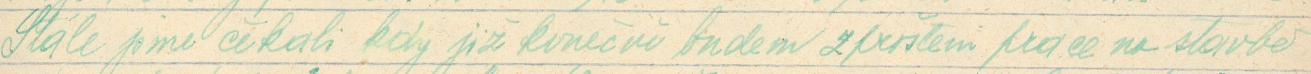Stále jsme čekali kdy již konečně budem zprošteni prace na stavbě
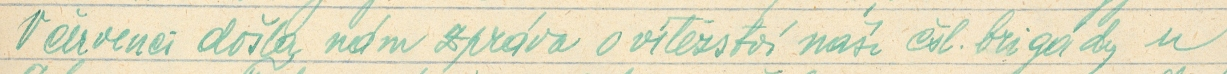V červenci došla nám zpráva o vítězství naší čsl. brigády u
